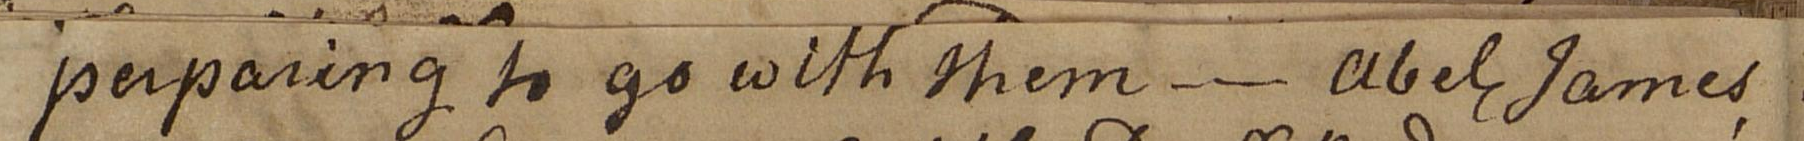perparing to go with them- Abel James,
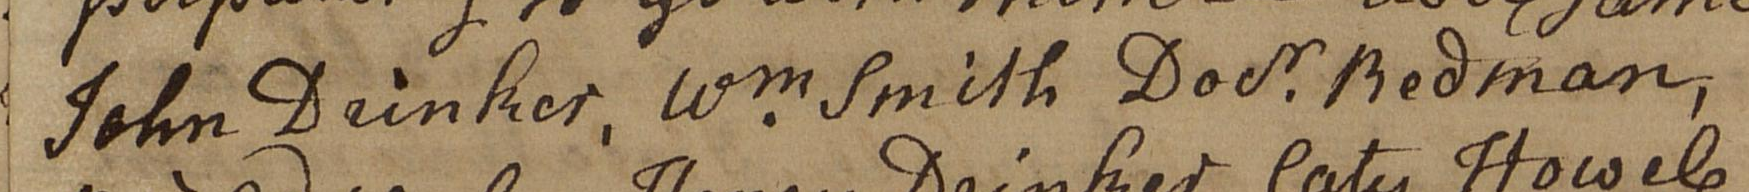John Drinker, W^m. Smith Doc^r. Redman,
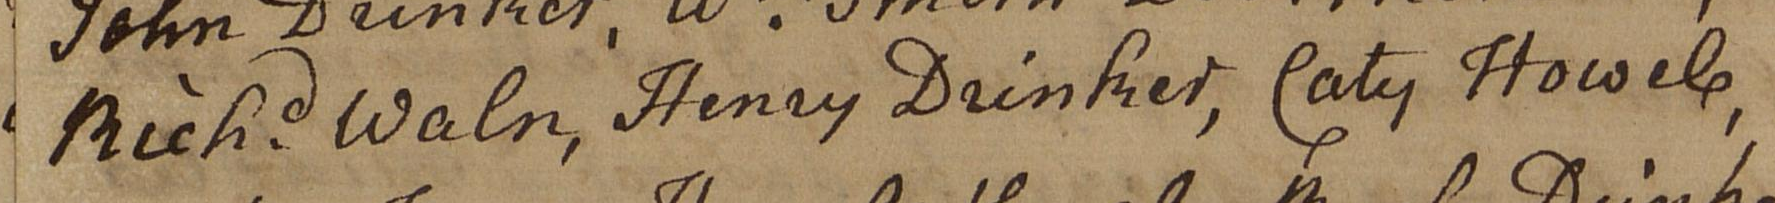Rich^d. Waln, Henry Drinker, Caty Howel,
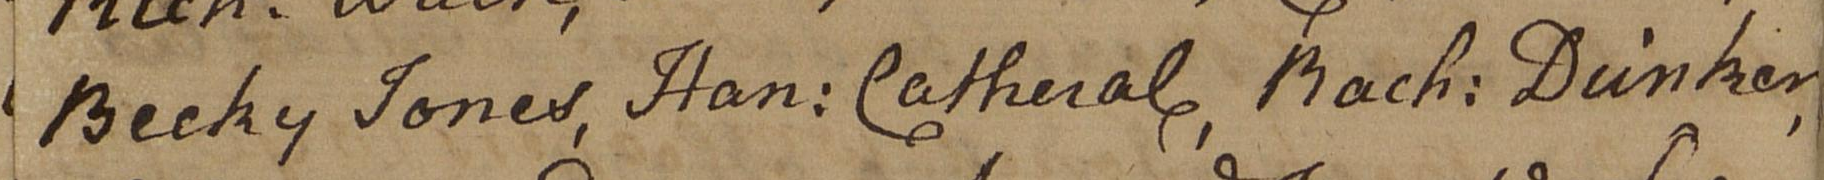Beeky Jones, Han: Catheral, Rach: Drinker,
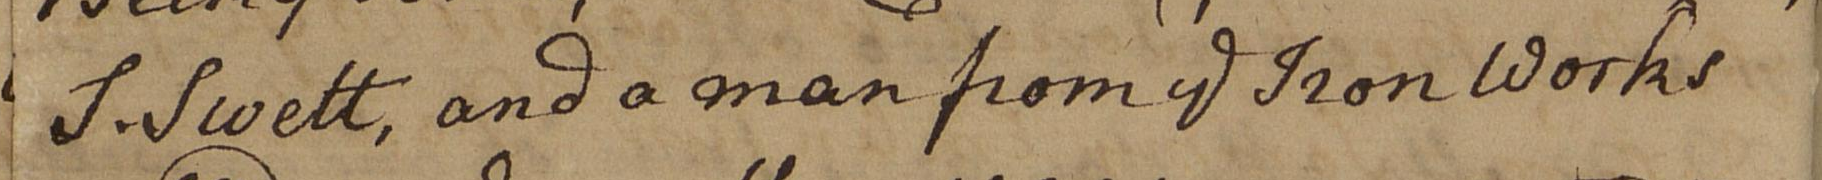S. Swett, and a man from y^e Iron Works
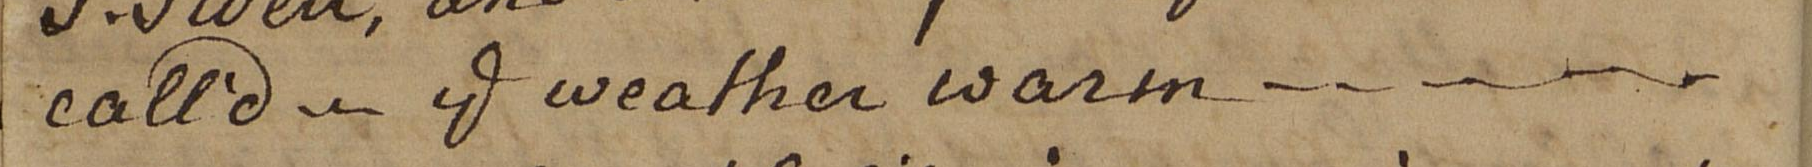call'd- y^e weather warm---
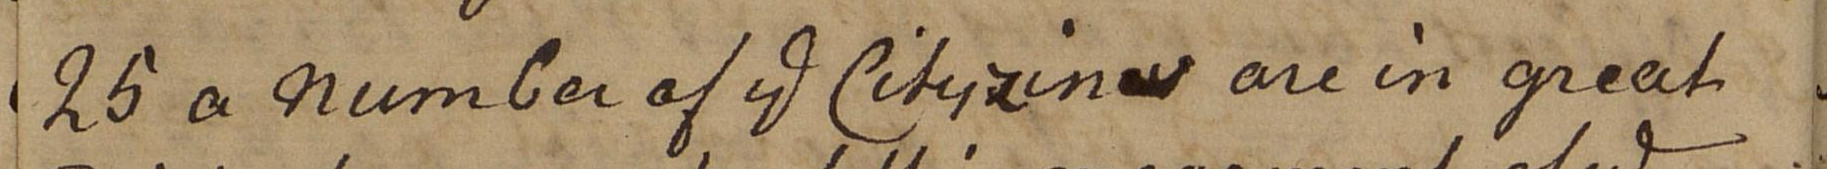25 a number of y^e Cityzins are in great
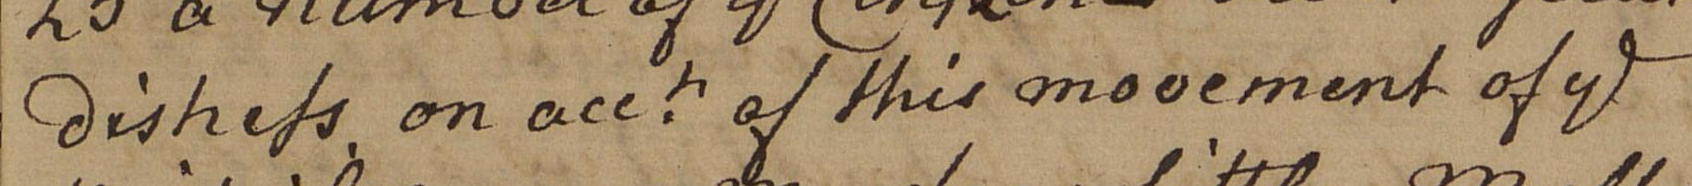distress, on acc^t. of this movement of y^e
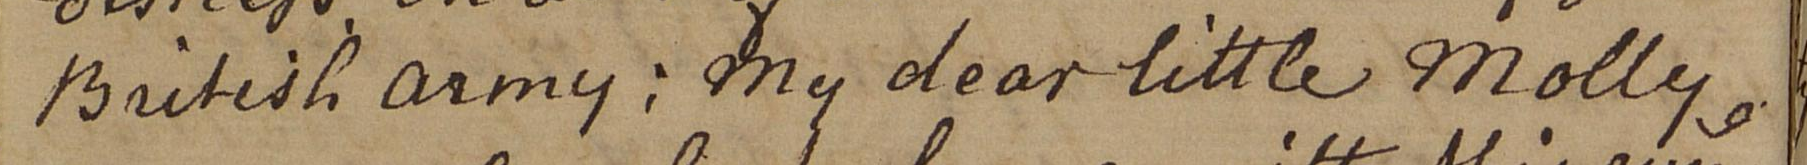British Army; my dear little Molly
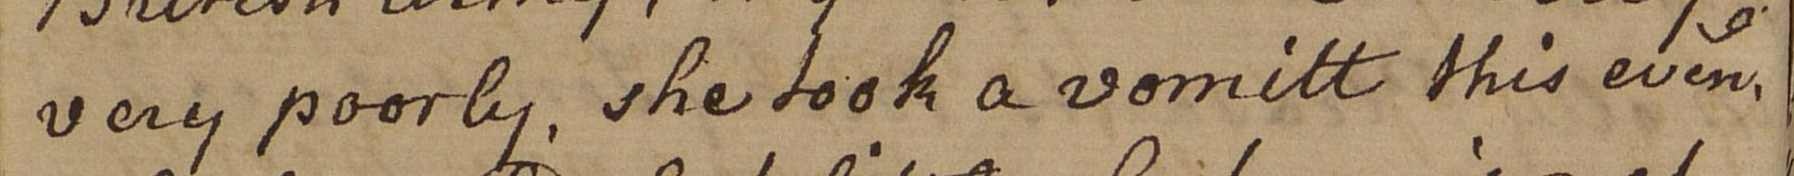very poorly, she took a vomitt this even^g.
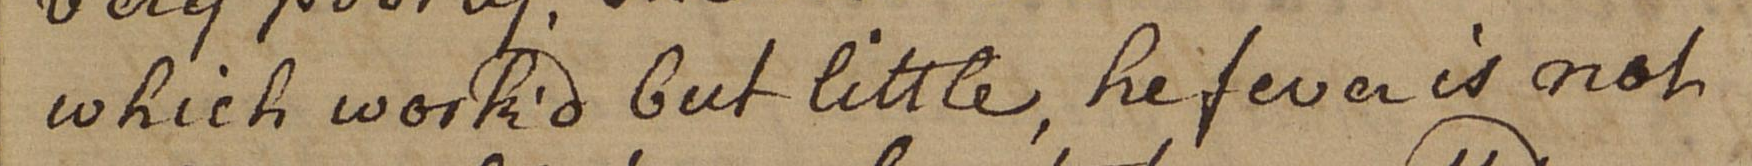which work'd but little, he fever is not
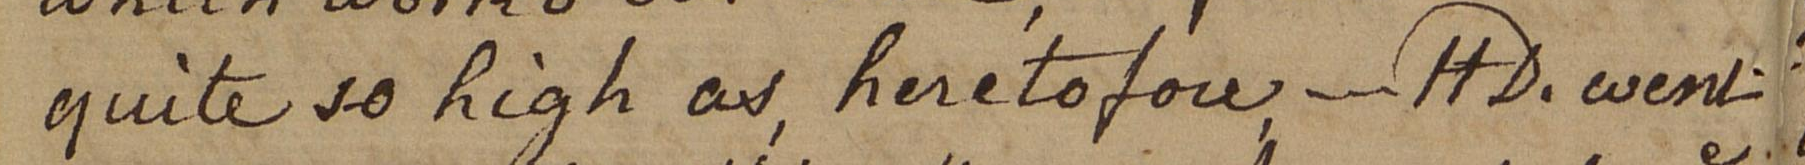quite so high as, heretofore,- HD. went
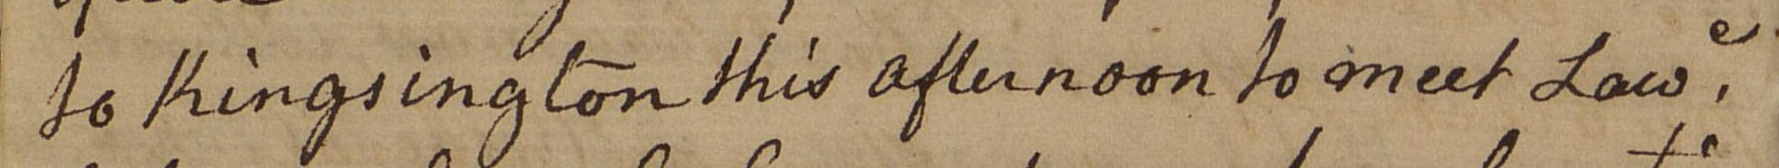to Kingsington this afternoon to meet Law^e.
